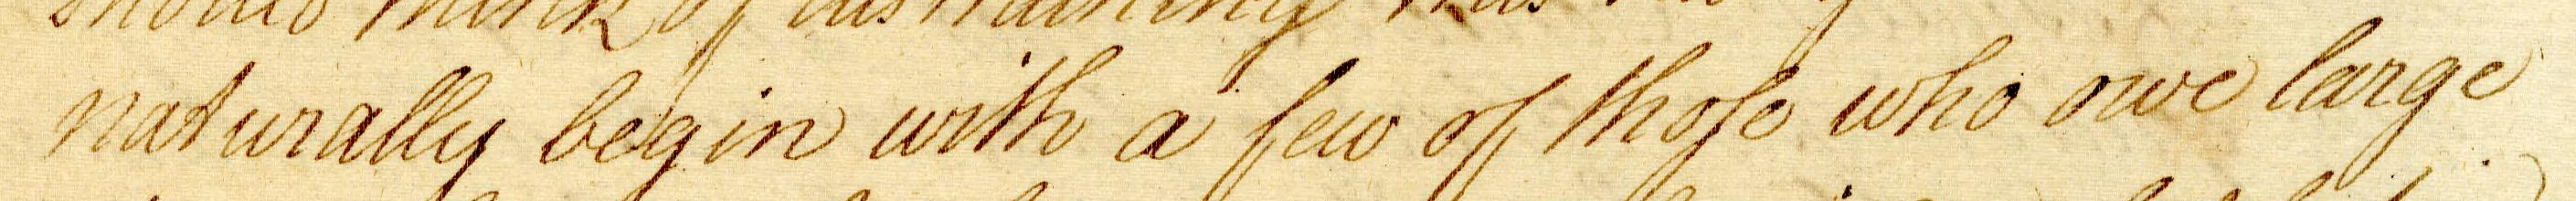naturally begin with a few of those who owe large
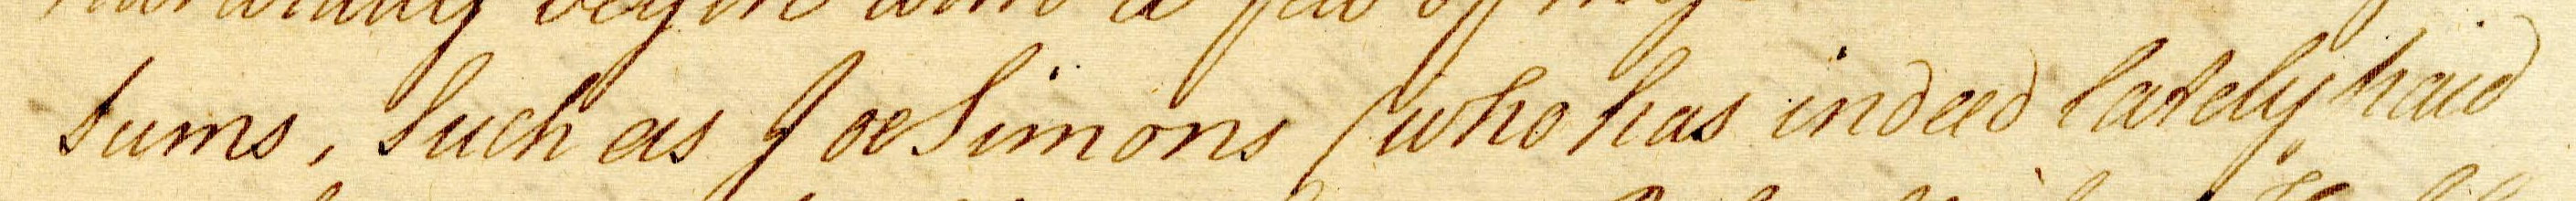Sums, Such as Joe Simons (who has indeed lately paid
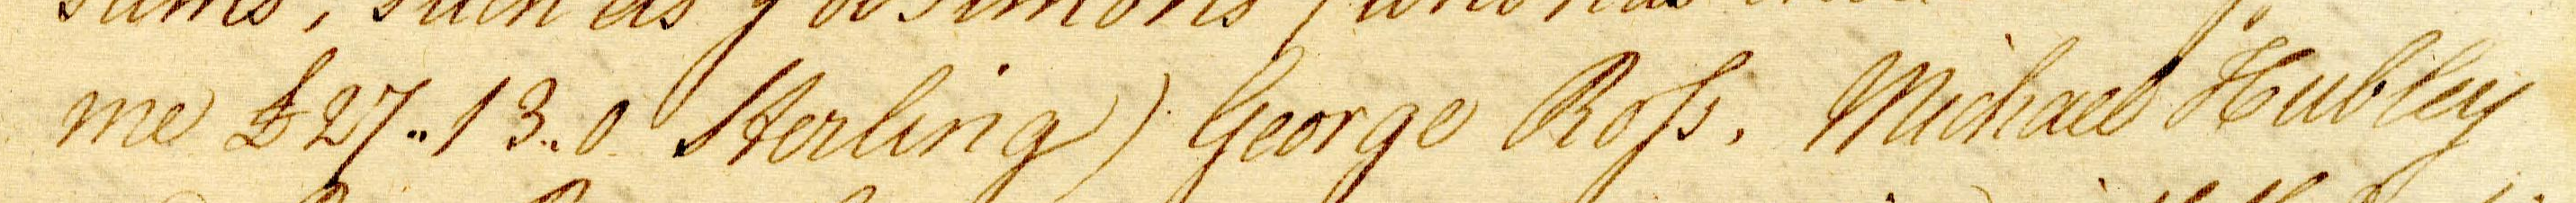me £27..13..0 Sterling) George Ross. Michael Hubley
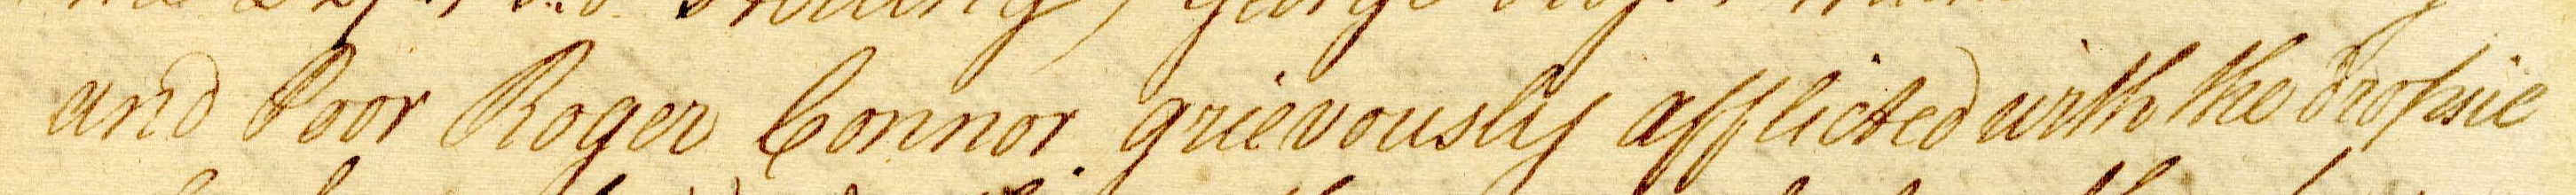and Poor Roger Connor grievously afflicted with the dropsie
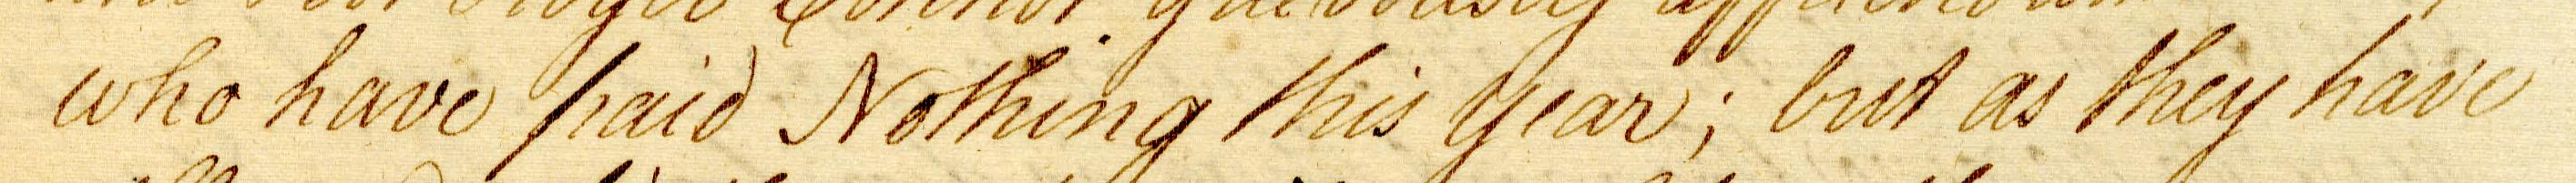who have paid Nothing this Year; but as they have
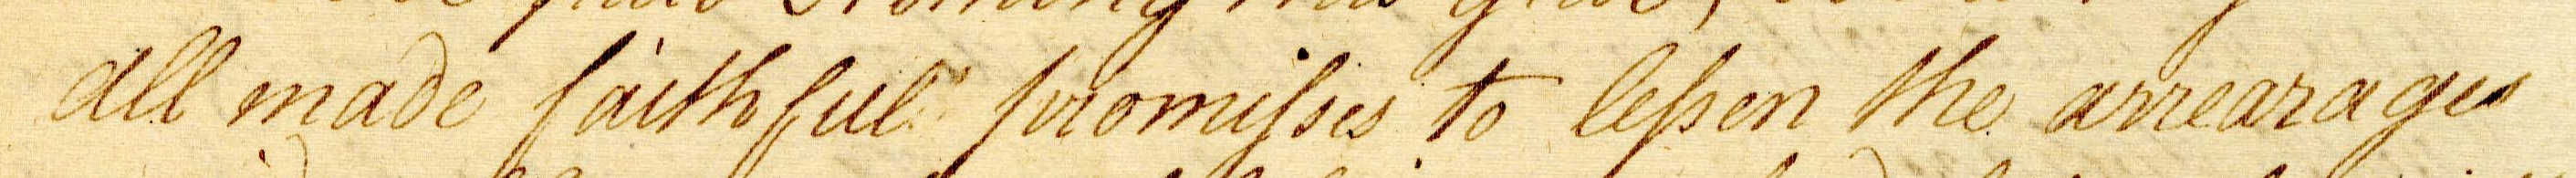All made faithful promisses to lessen the arrearages
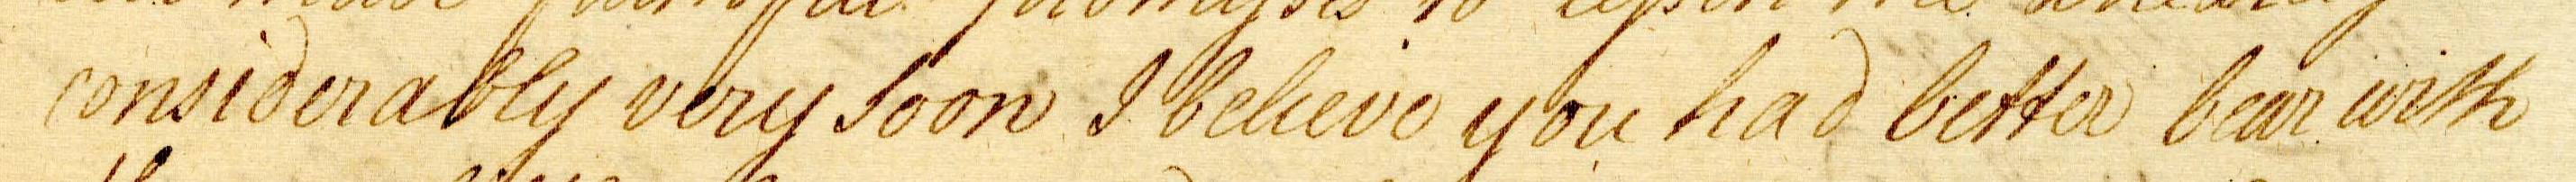considerably very Soon I believe you had better bear with
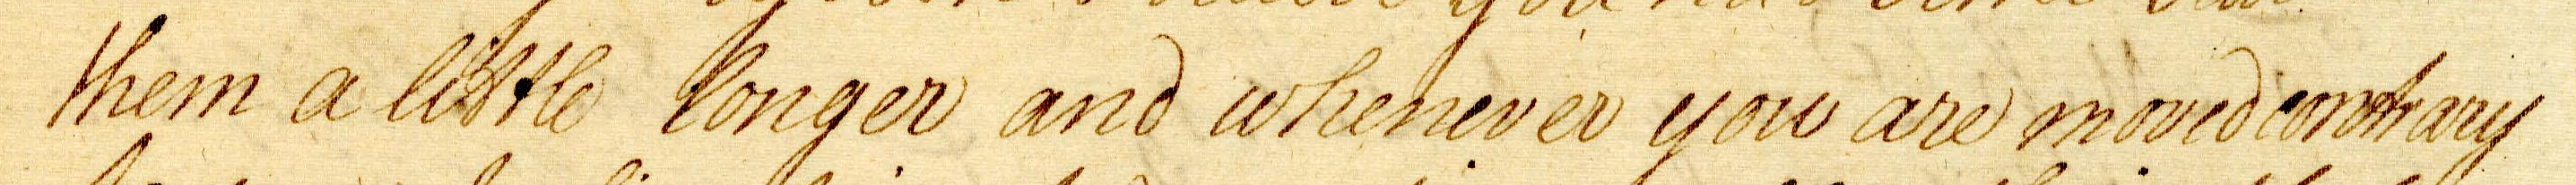them a little longer and whenever you are moved contrary
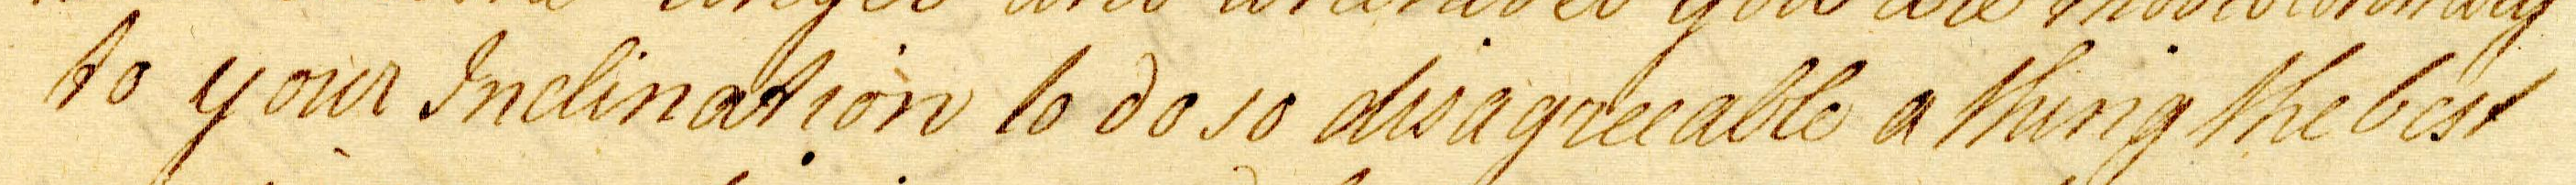to your Inclination to do so disagreeable a thing the best
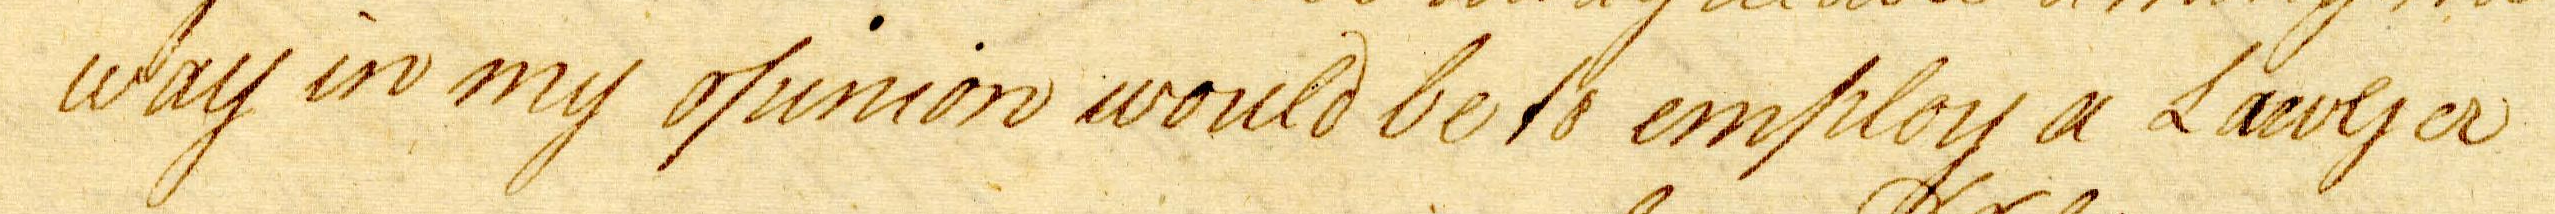way in my opinion would be to employ a Lawyer
